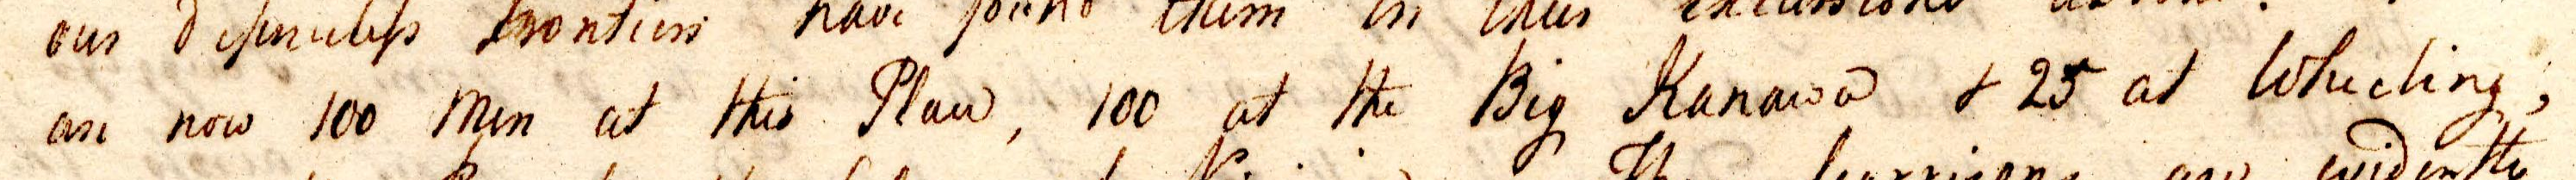are now 100 Men at this Place, 100 at the Big Kanawa & 25 at Wheeling,
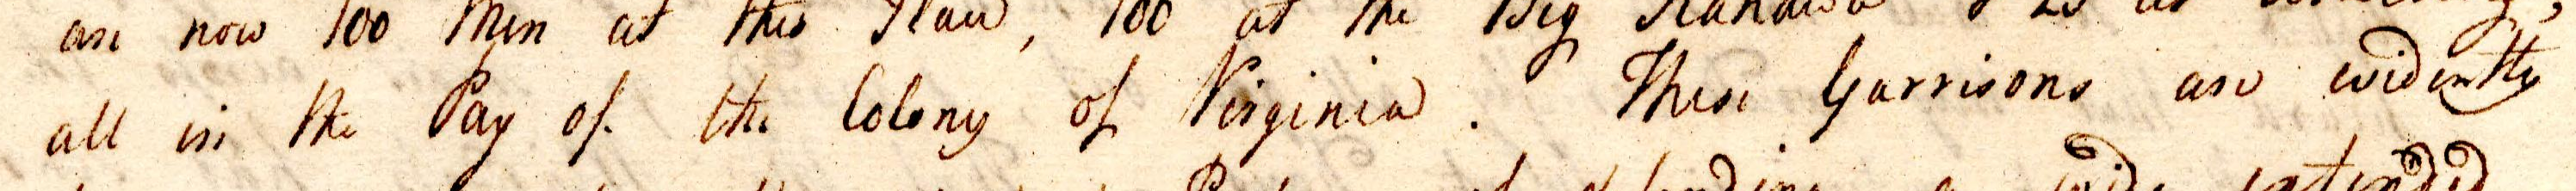all in the Pay of the Colony of Virginia. These Garrisons are evidently
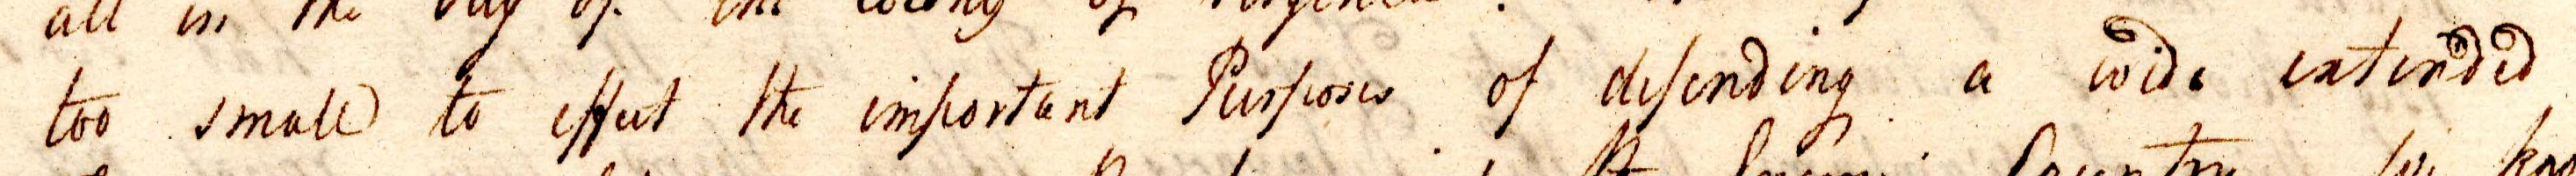too small to effect the important Purposes of defending a wide extended
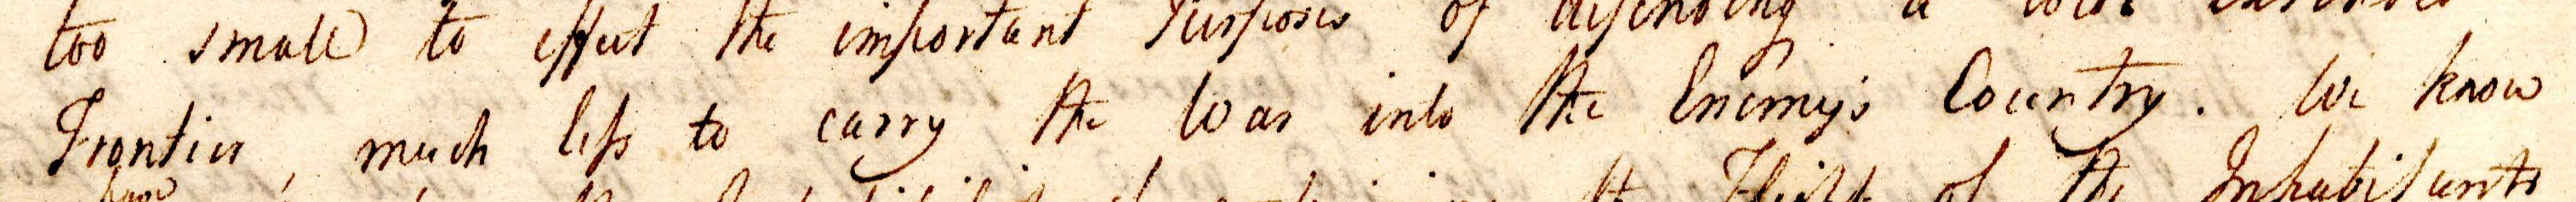Frontier, much less to carry the war into the Enemy's Country. We know
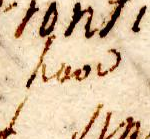have
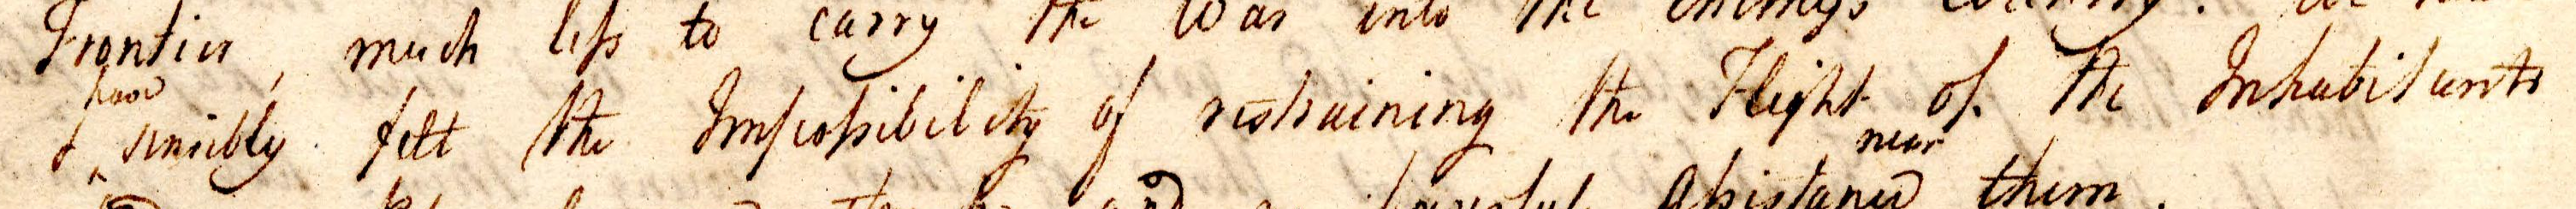& ^ sensibly felt the Impossibility of restraining the Flight of the Inhabitants
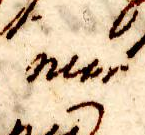near
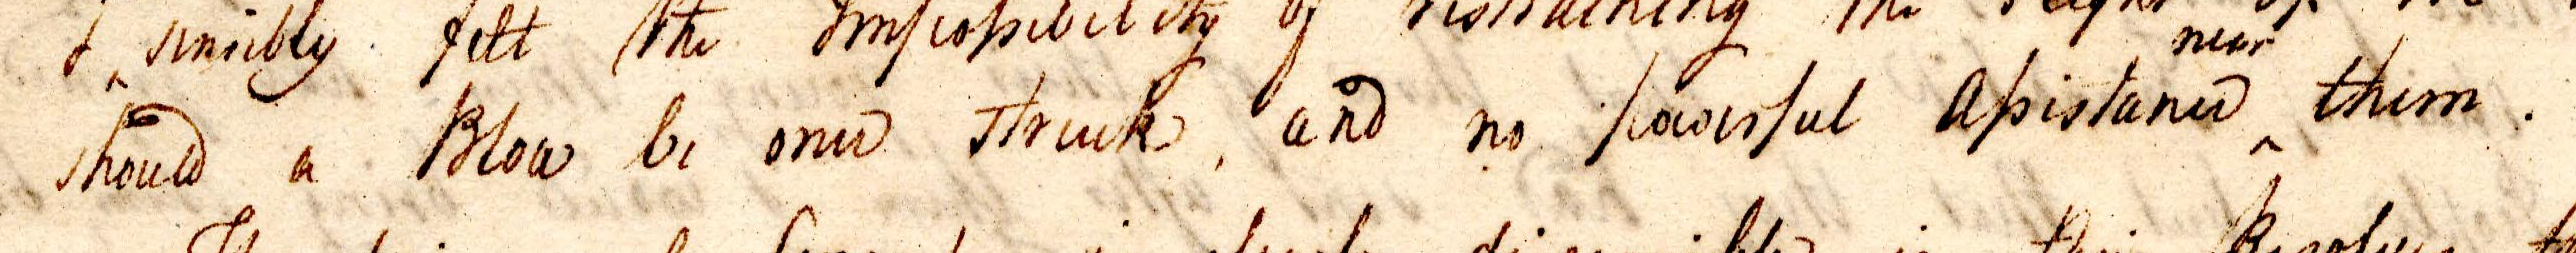should a Blow be once struck, and no powerful Assistance ^ them.
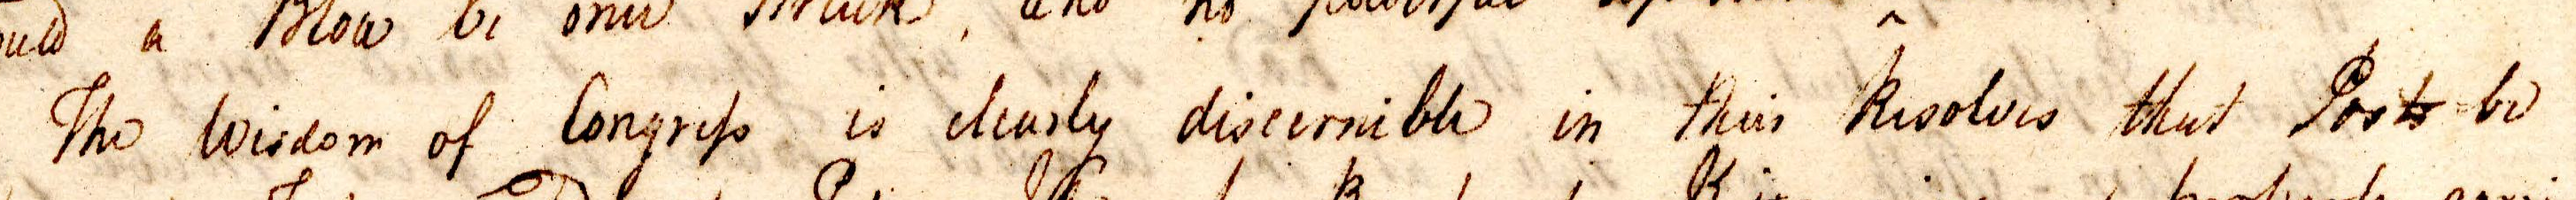The Wisdom of Congress is clearly discernible in their Resolves that Posts be
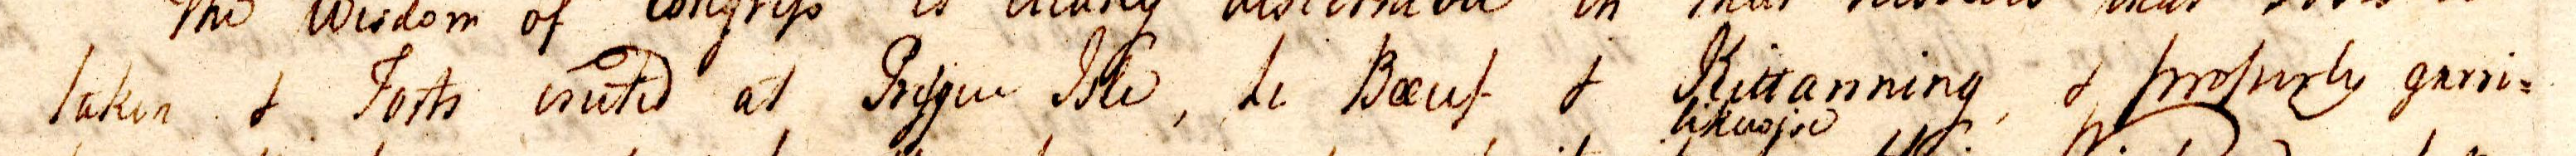taken & Forts created at Presque Isle, Le Boeuf & Kittanning, & properly garri-
